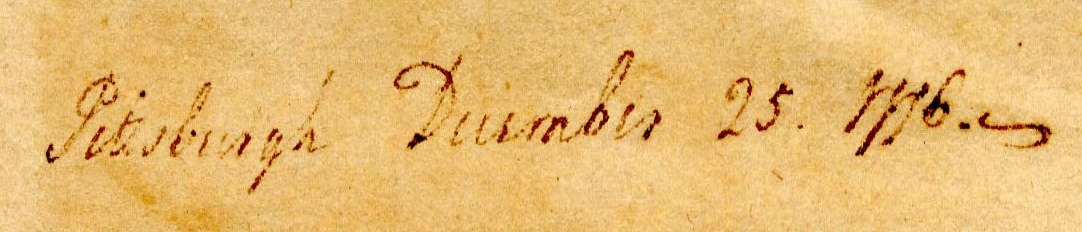Pittsburgh December 25. 1776.-
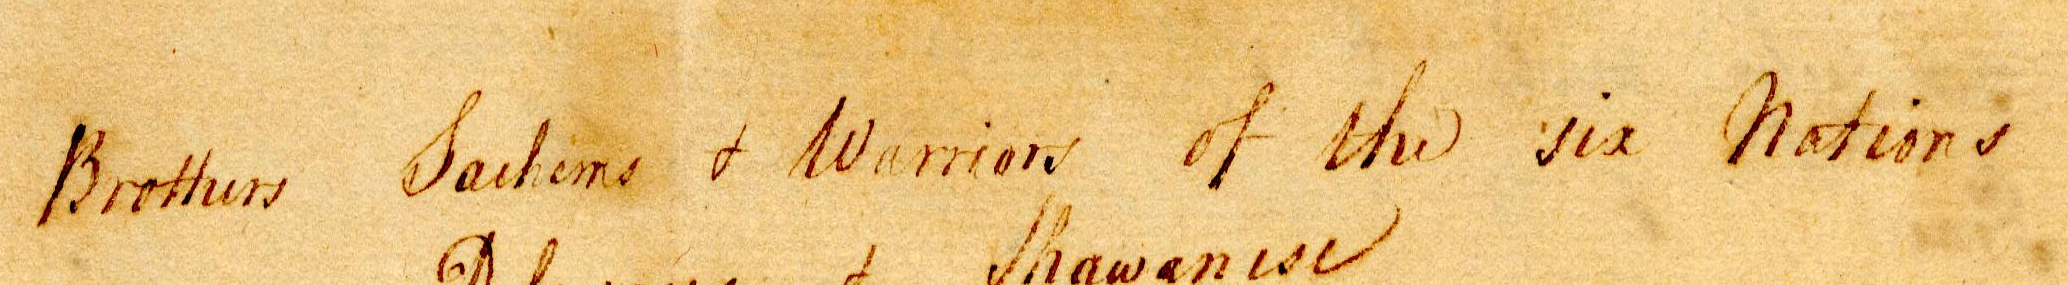Brothers Sachems & Warriors of the six Nations
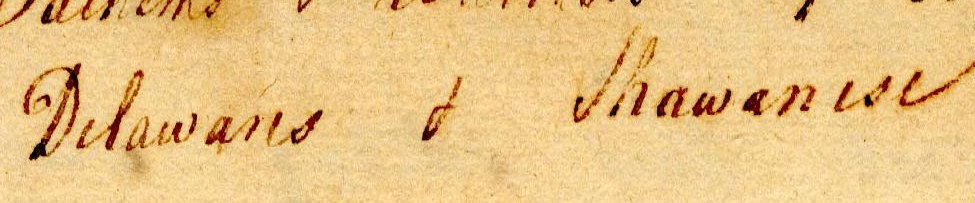Delawares & Shawanese
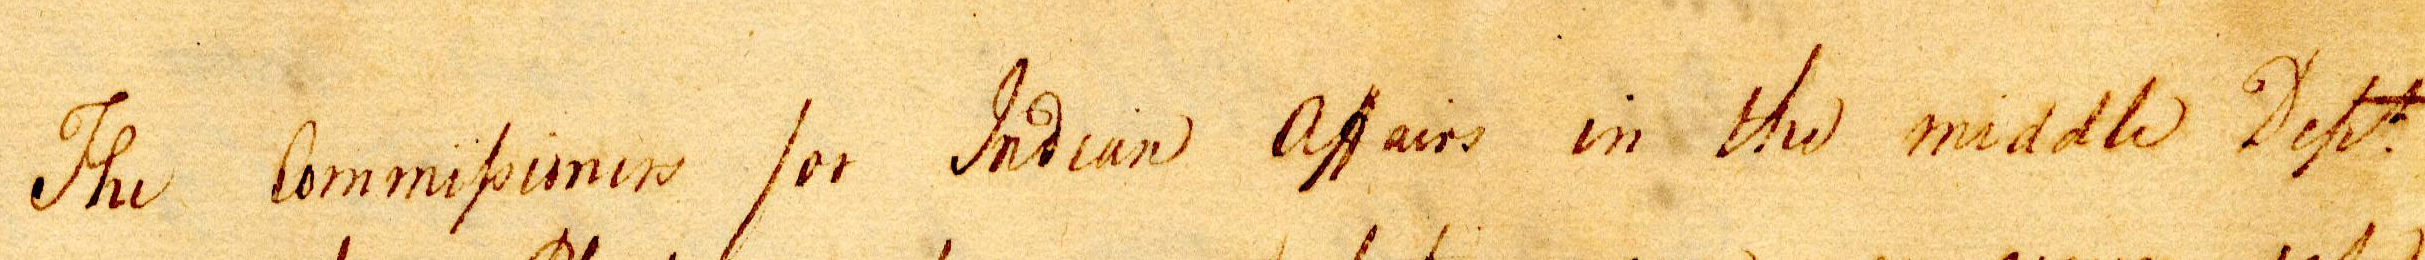The Commissioners for Indian Affairs in the middle Dep^t.
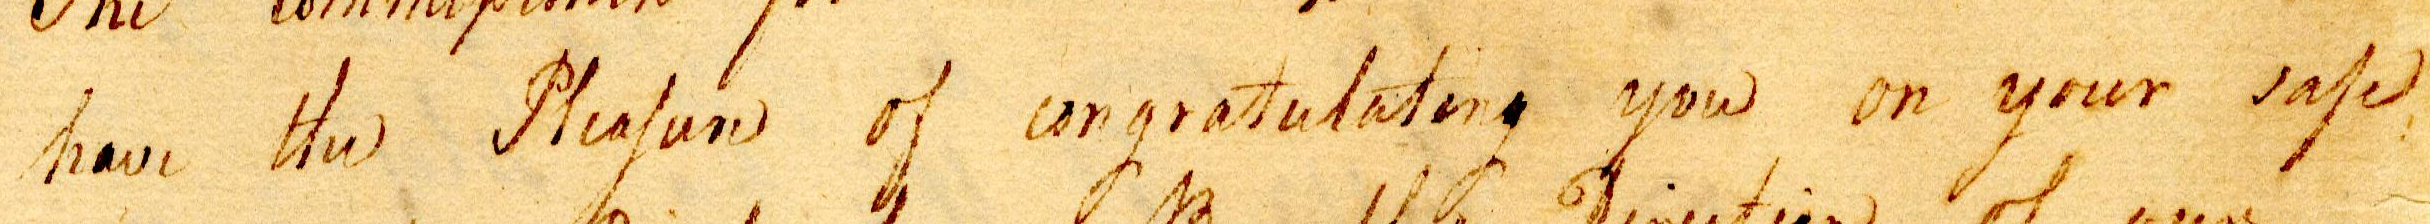have the Pleasure of congratulating you on your safe
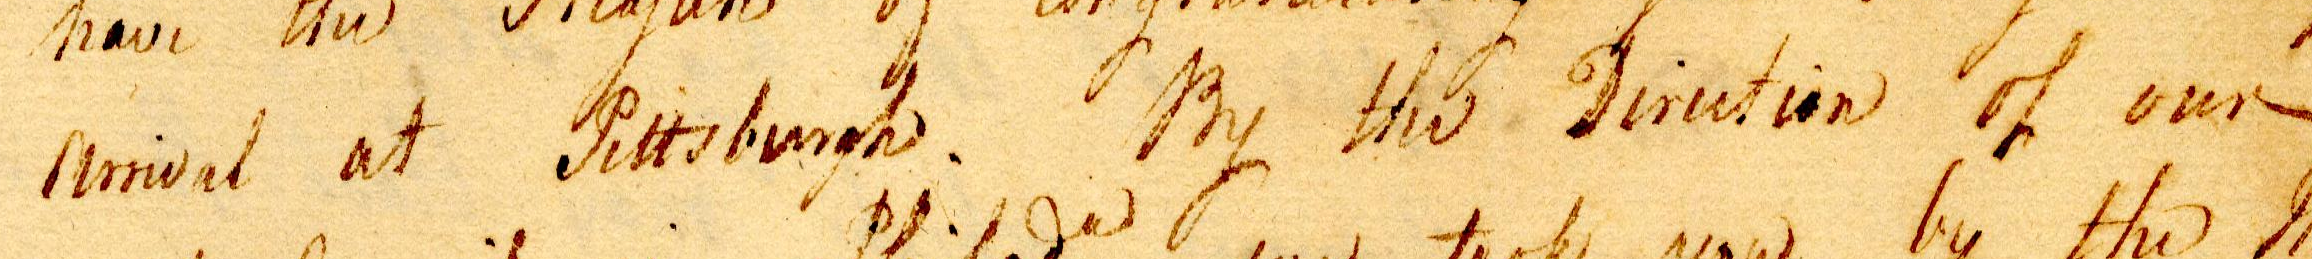Arrival at Pittsburgh. By the Direction of our
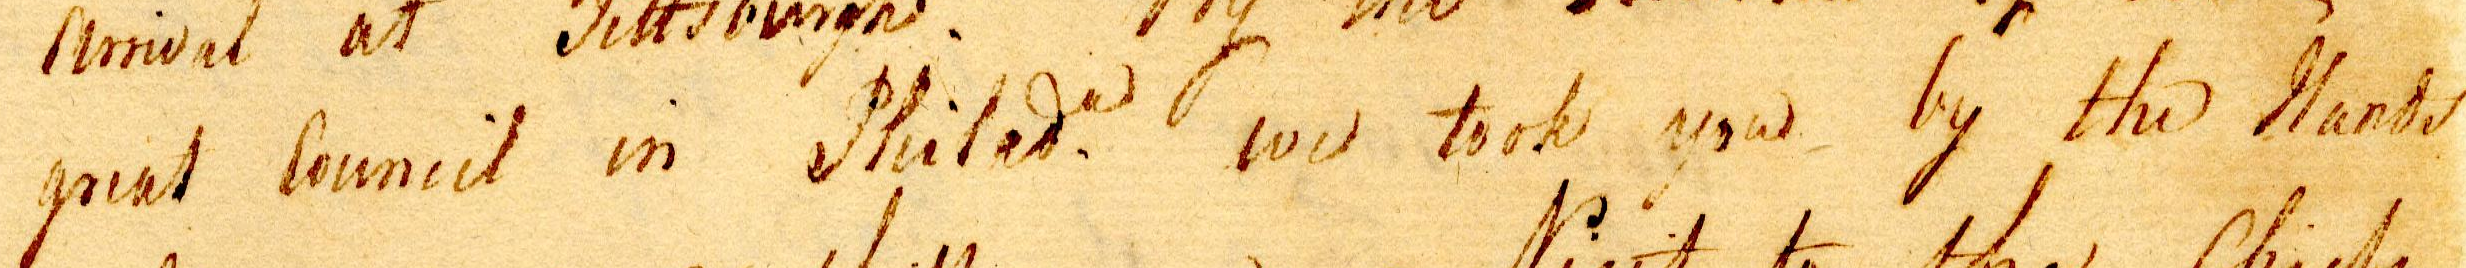great Council in Philad^a. we took you by the Hands
